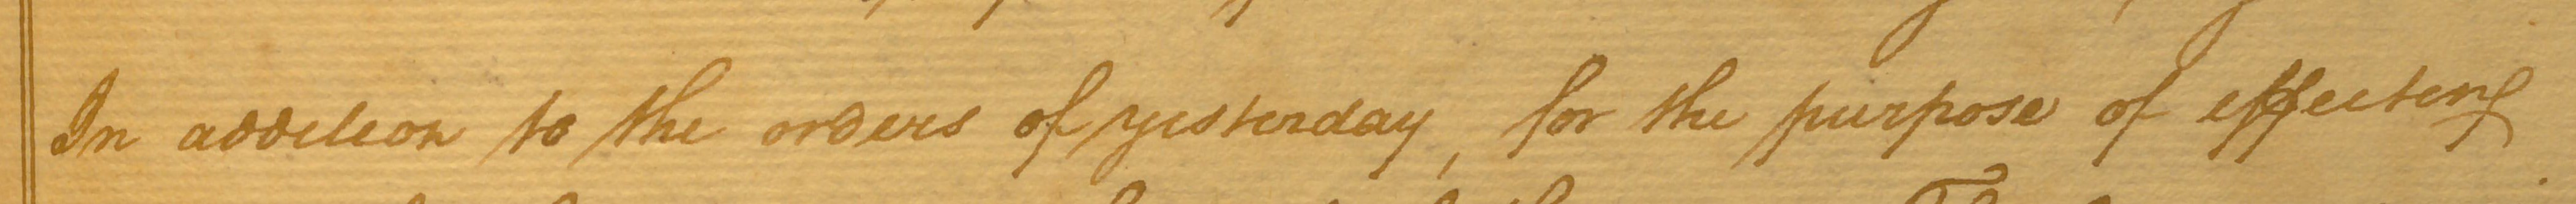In addition to the orders of yesterday, for the purpose of effecting
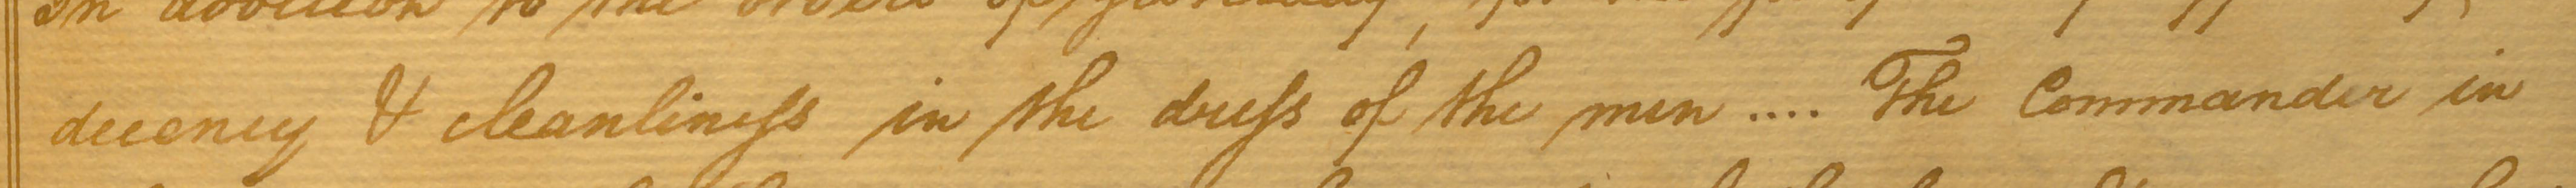decency & cleanliness in the dress of the men.... The Commander in
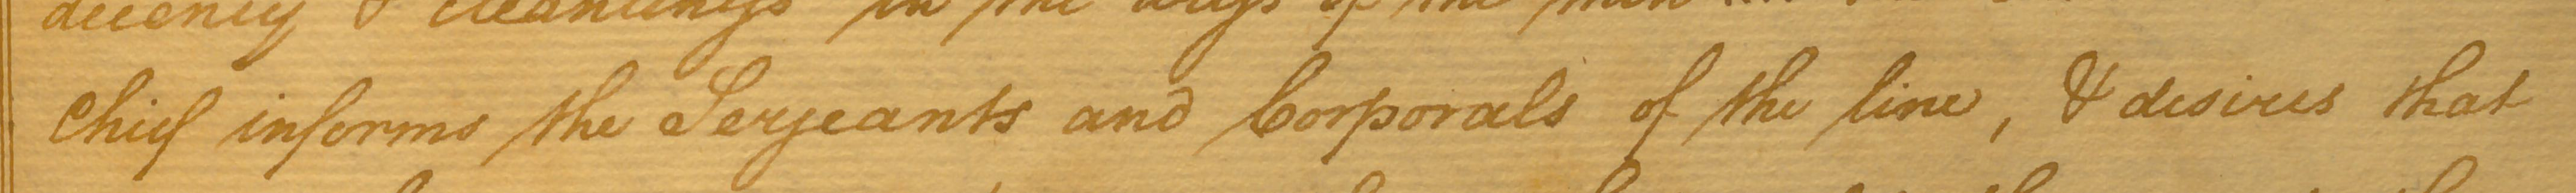Chief informs the Serjeants and Corporals of the line, & desires that
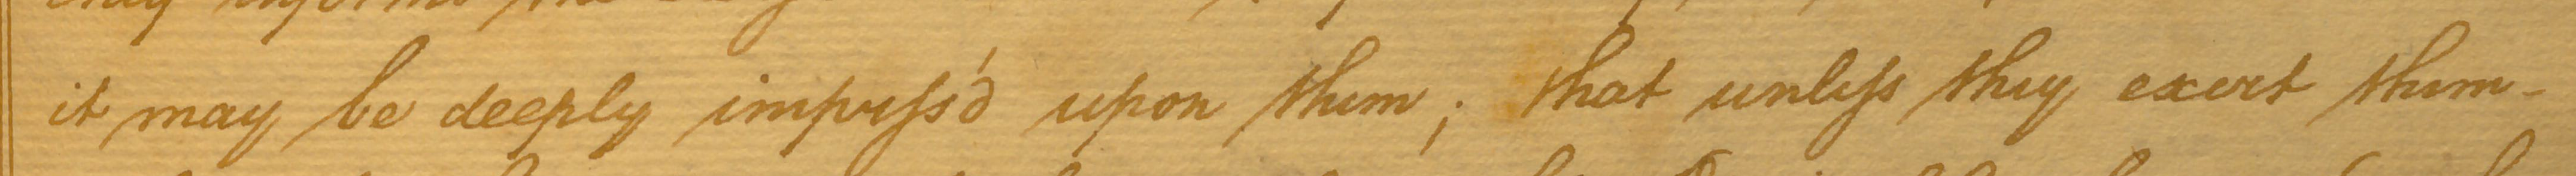it may be deeply impress'd upon them; that unless they exert them-
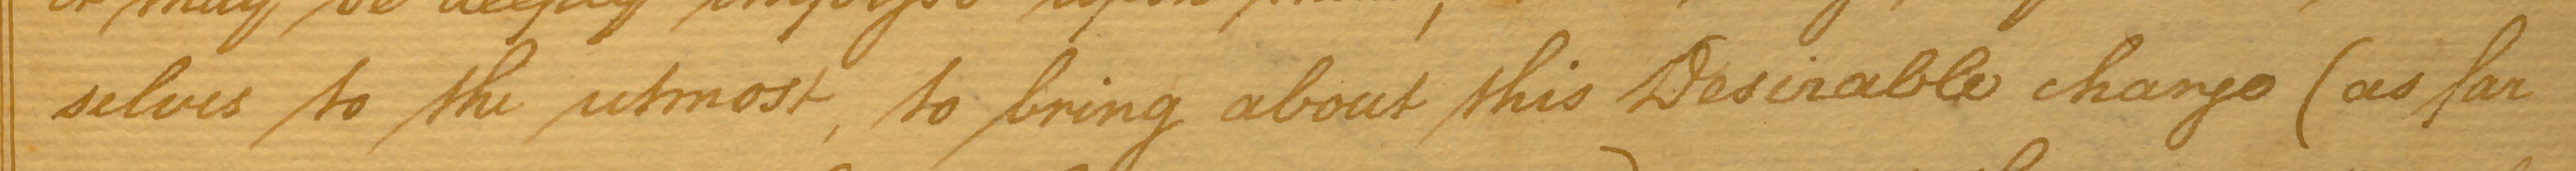selves to the utmost, to bring about this Desirable change (as far
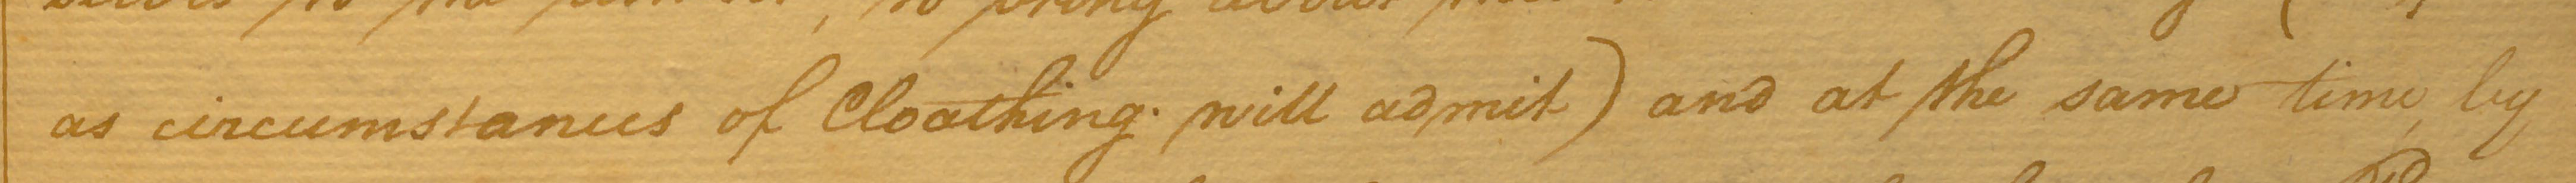as circumstances of Cloathing will admit) and at the same time by
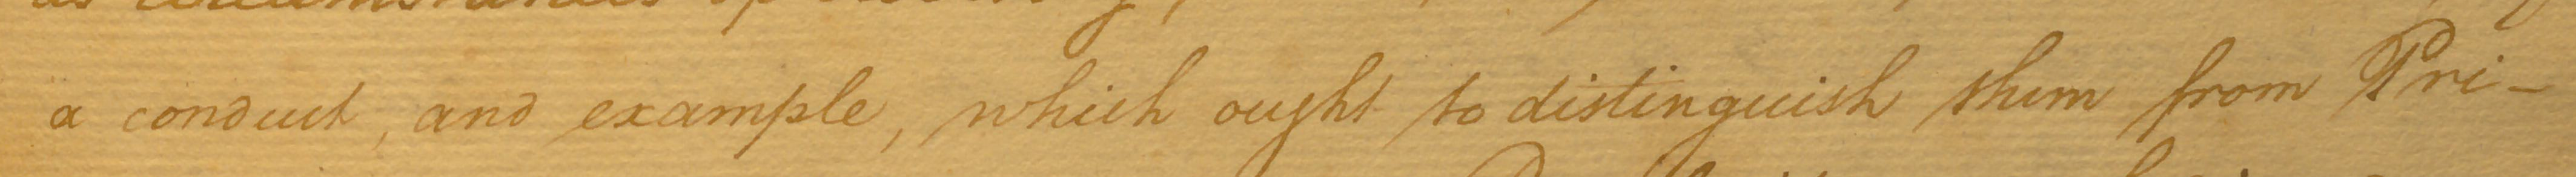a conduct, and example, which ought to distinguish them from Pri-
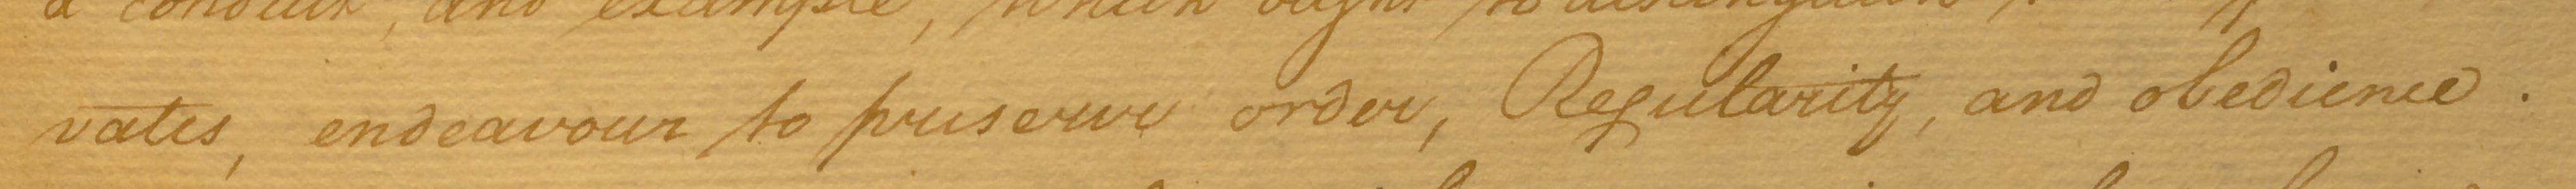vates, endeavour to preserve order, Regularity, and obedience.
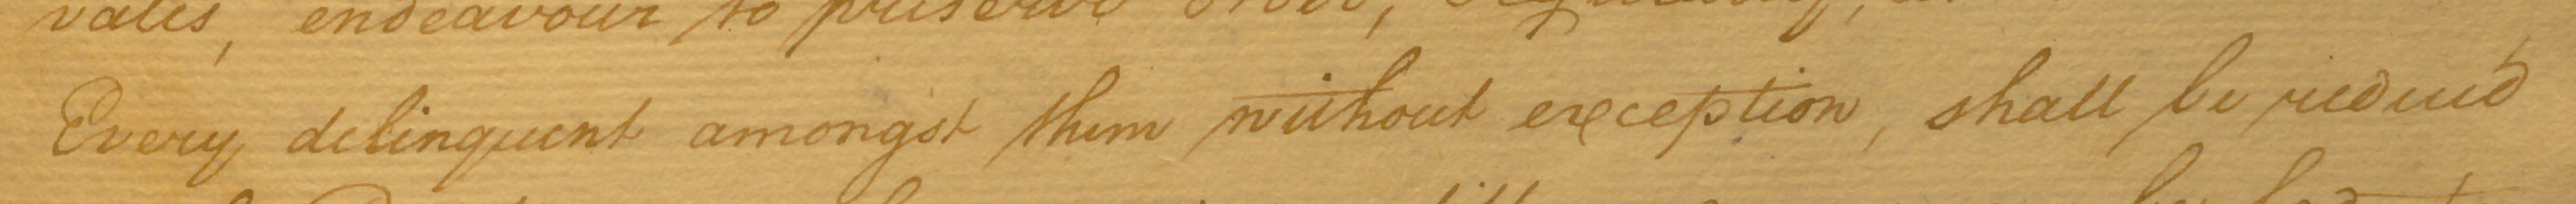Every delinquent amongst them without exception, shall be reduced
